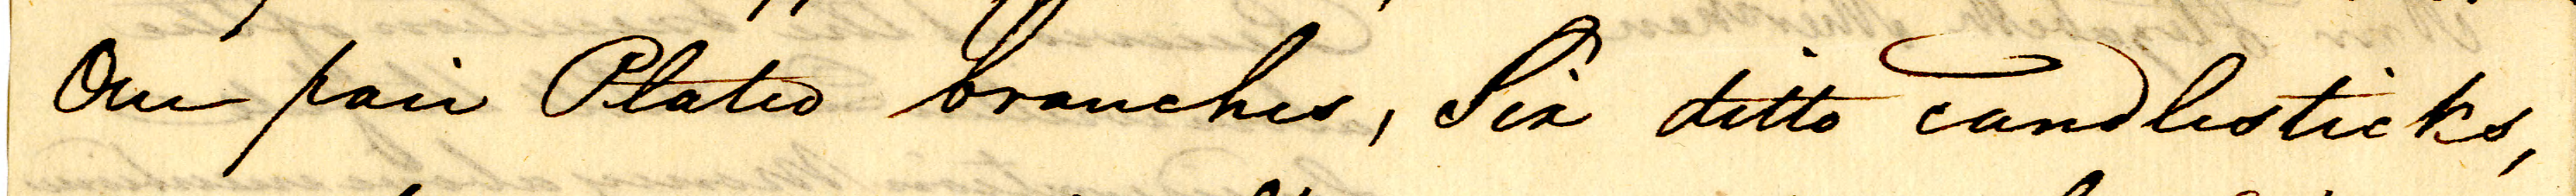one pair Plated branches, Six ditto candlesticks,
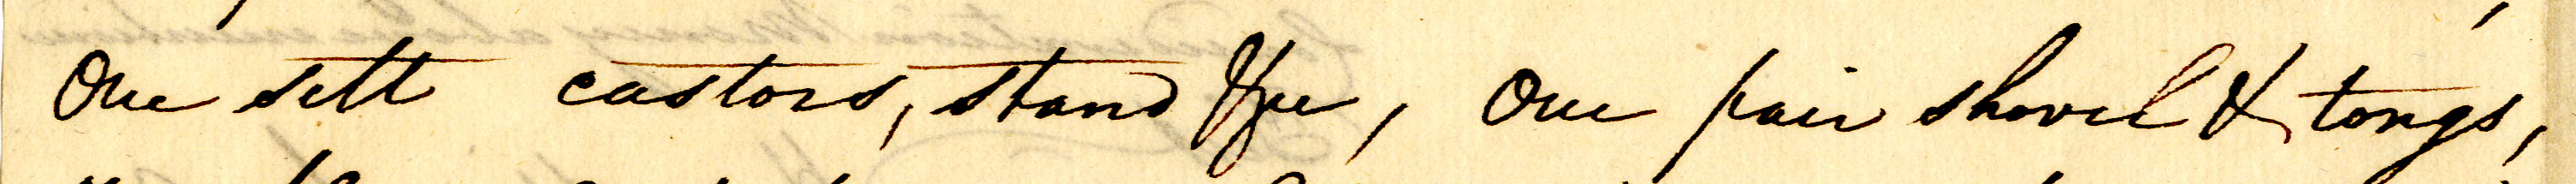one sett castors, stand &c, one pair shovel & tongs,
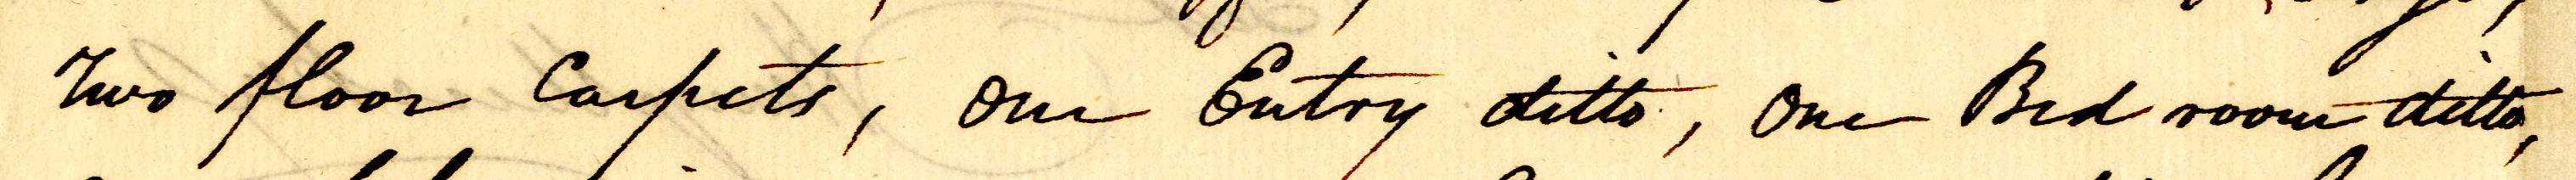Two floor carpets, one Entry ditto, one Bed room ditto,
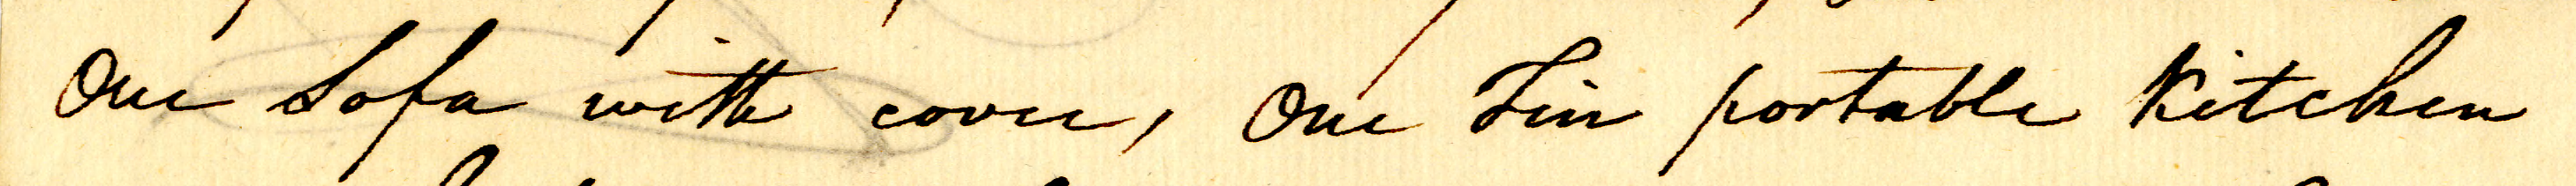one Sofa with cover, one Tin portable kitchen
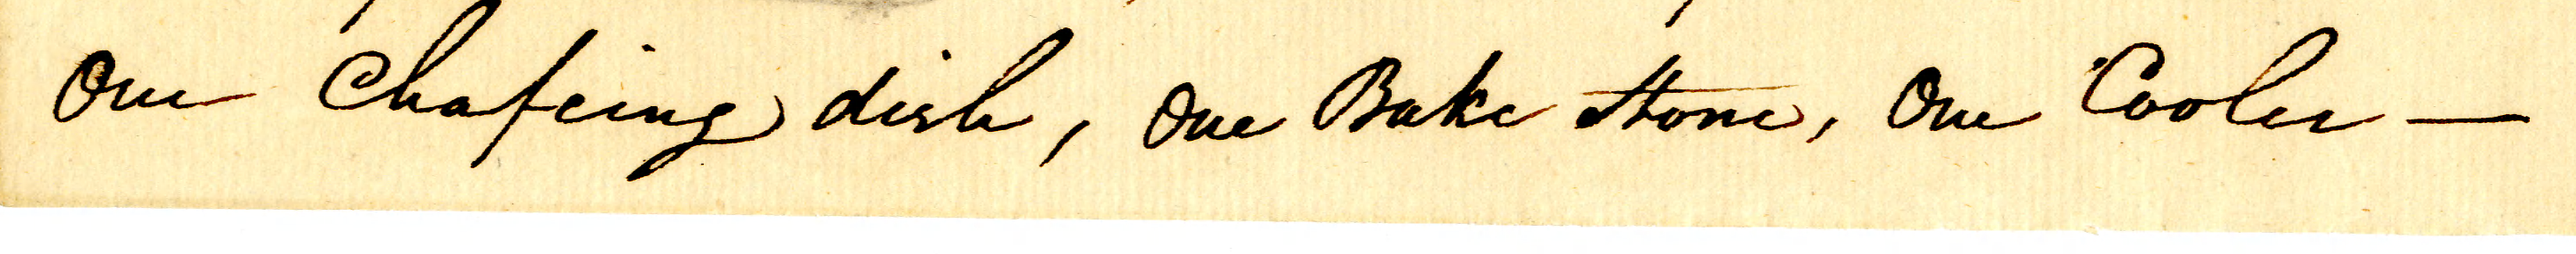one chafeing dish, one Bake stone, one cooler-
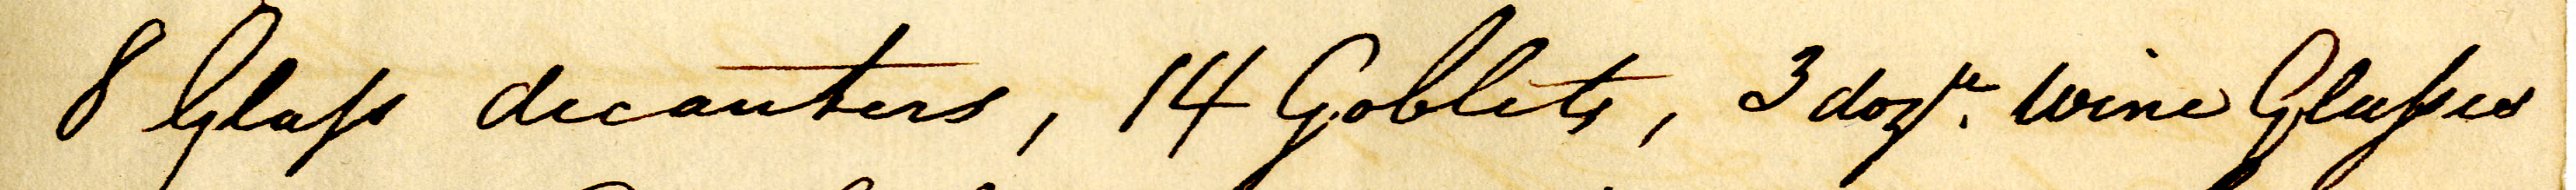8 Glass decanters, 14 Goblets, 3 doz^n. wine Glasses
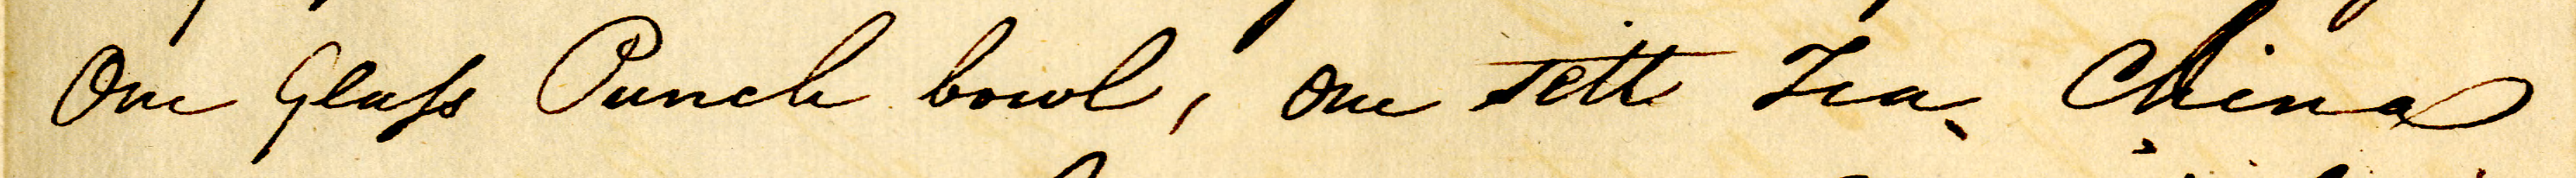one Glass Punch bowl, one sett Tea China
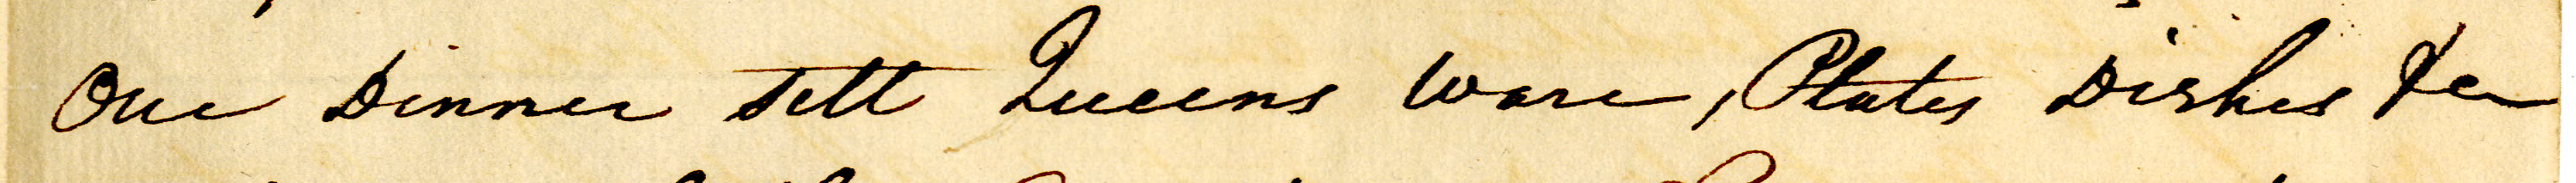One Dinner sett Queens ware, Plates Dishes &c
